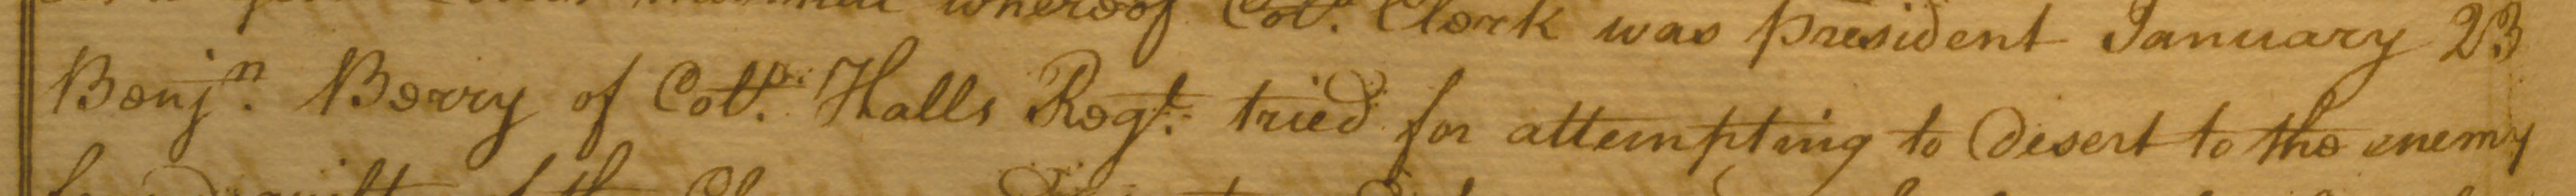Benj^n. Berry of Col^o. Halls Reg^t. tried for attempting to desert to the enemy
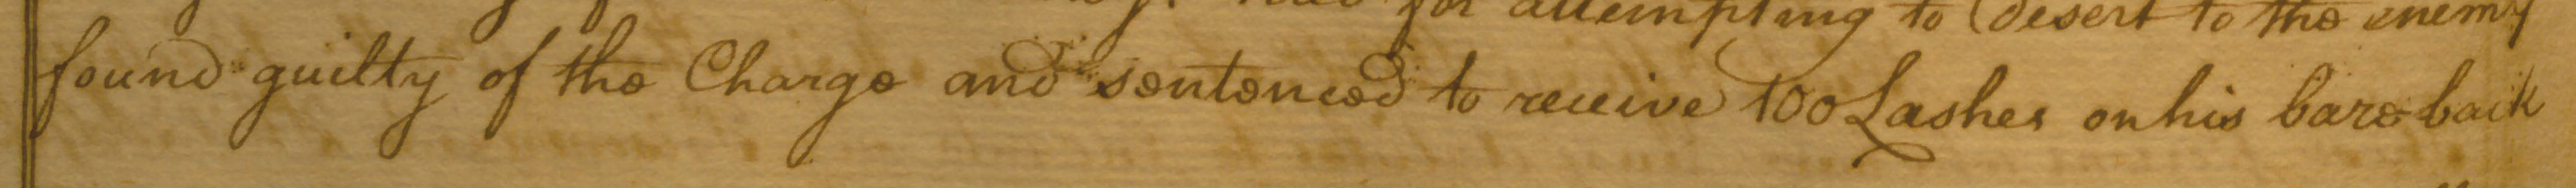found guilty of the Charge and sentenced to receive 100 Lashes on his bare back
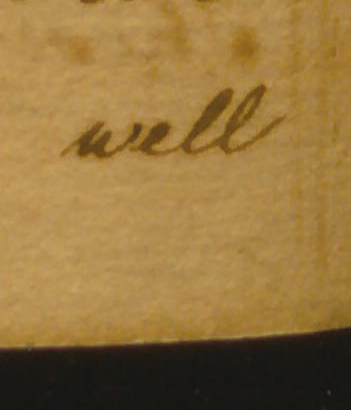well
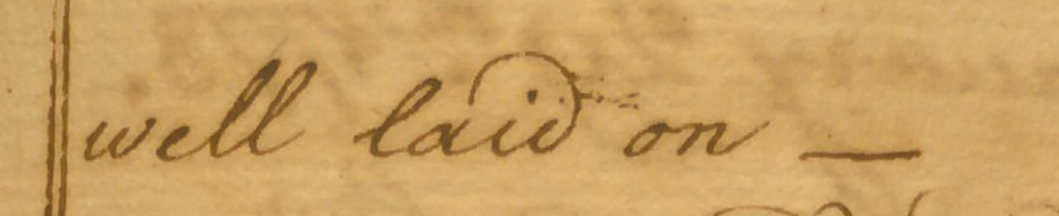well laid on-
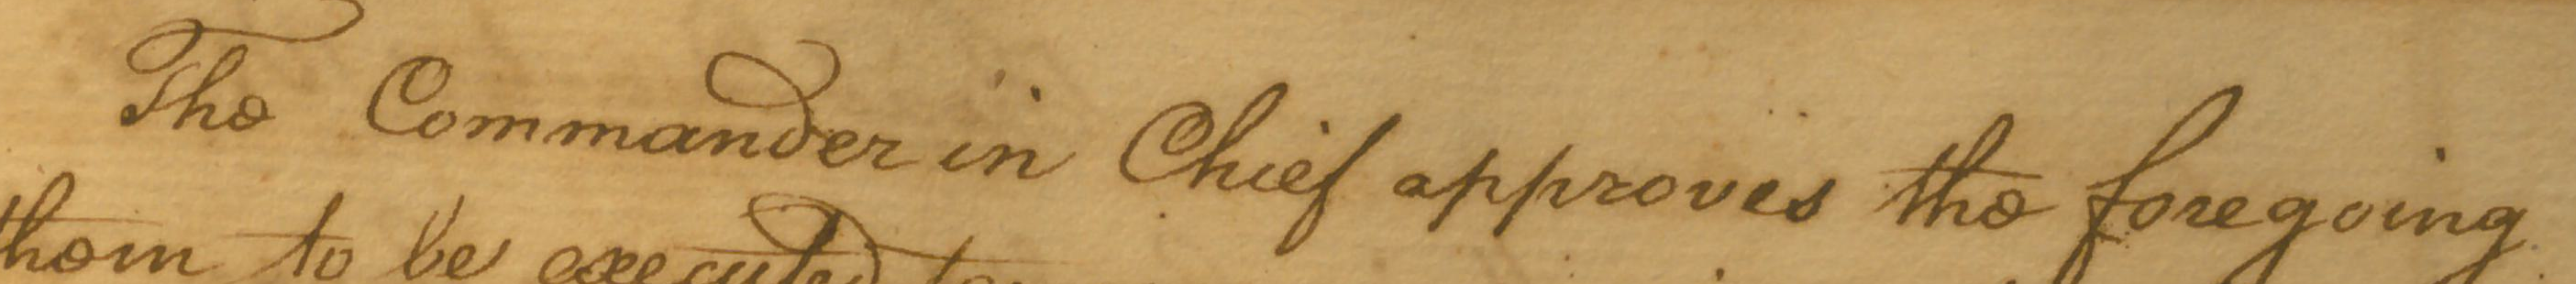The Commander in Chief approves the foregoing
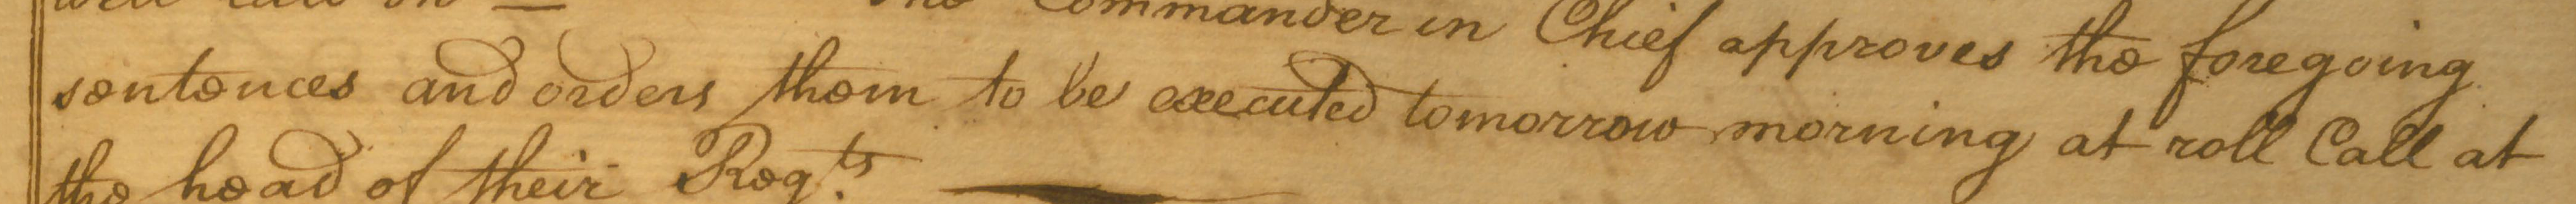sentencese and orders them to be executed tomorrow morning at roll Call at
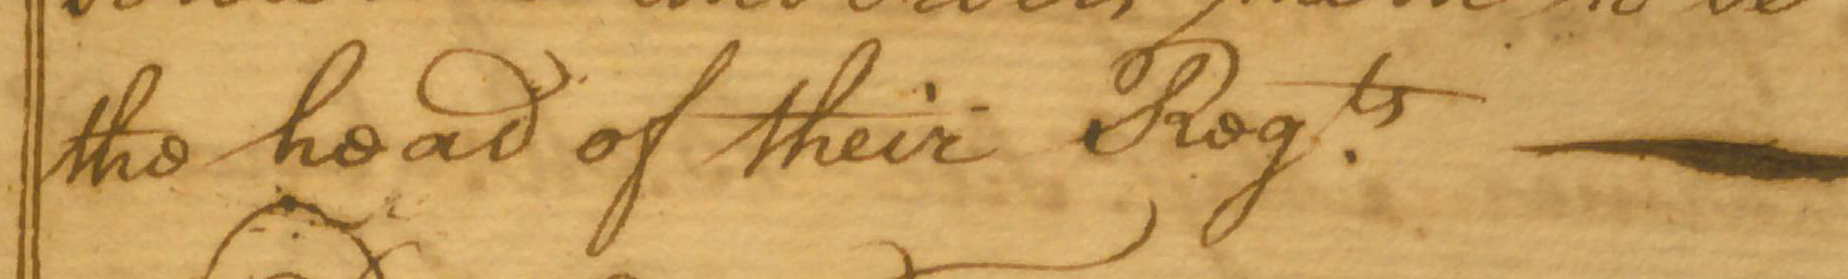the head of their Reg^ts.-
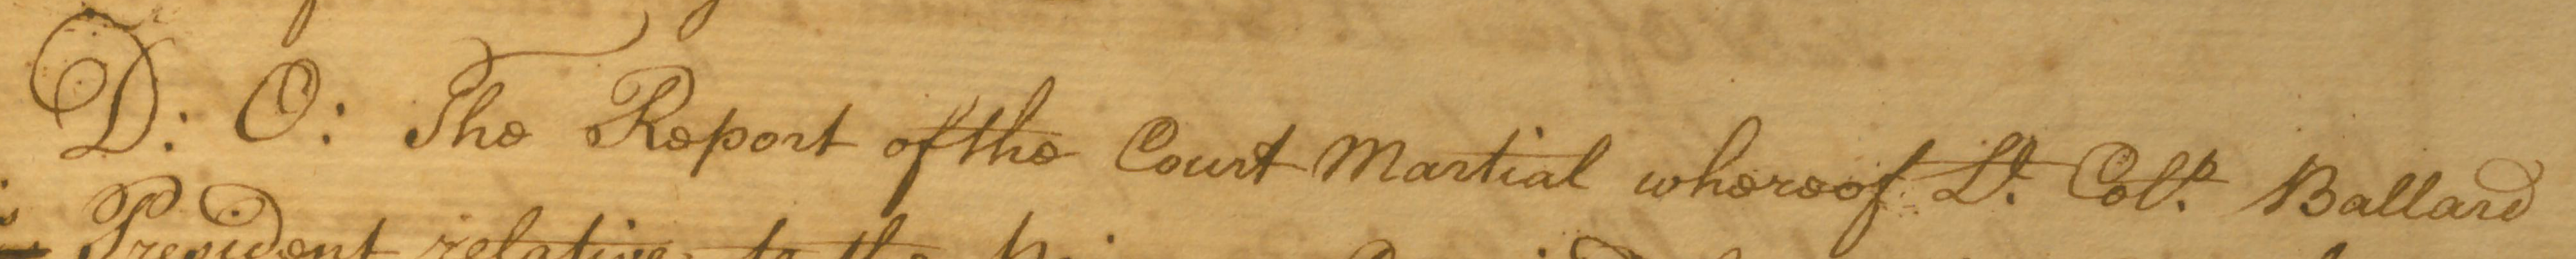D: O: The Report of the Court Martial whereof L^t. Col^o. Ballard
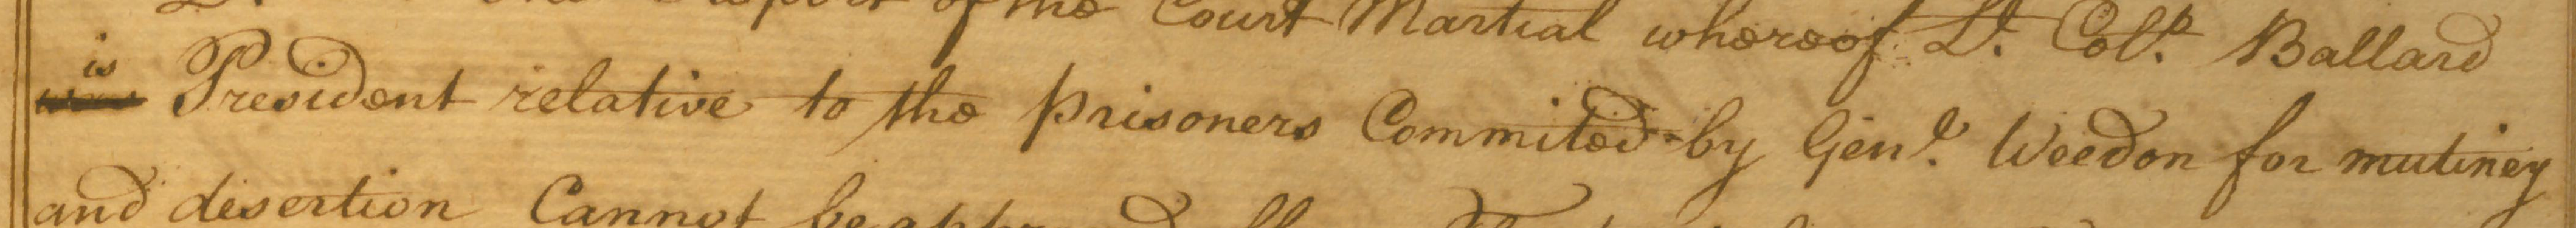is President relative to the prisoners Commited by Gen^l. Weedon for muting
